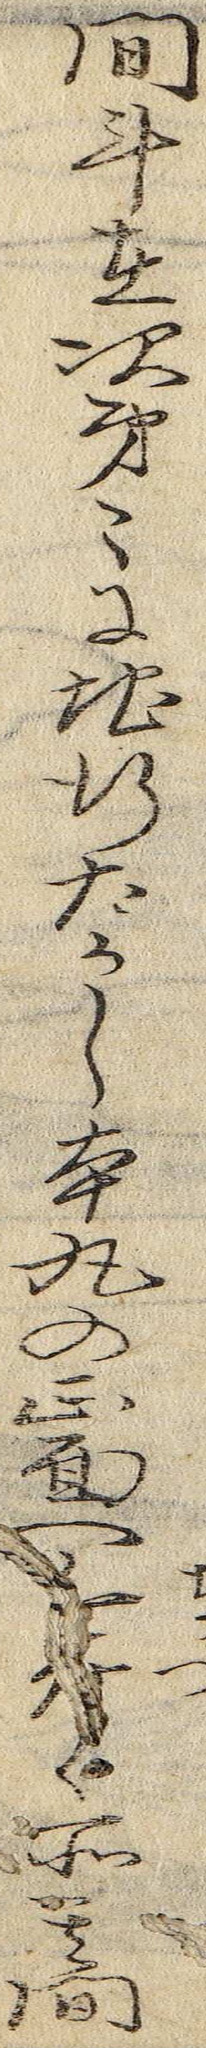間斗在次第々に地行たかし本丸の正面へ近付く所其間
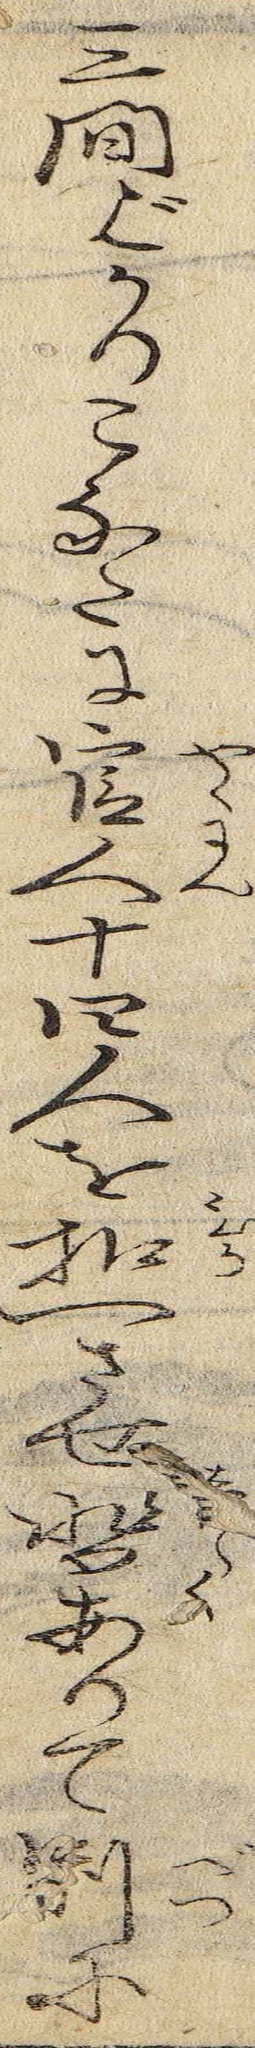三間ばかりこなたに官人十四人を扣へさせ暫ありて別に
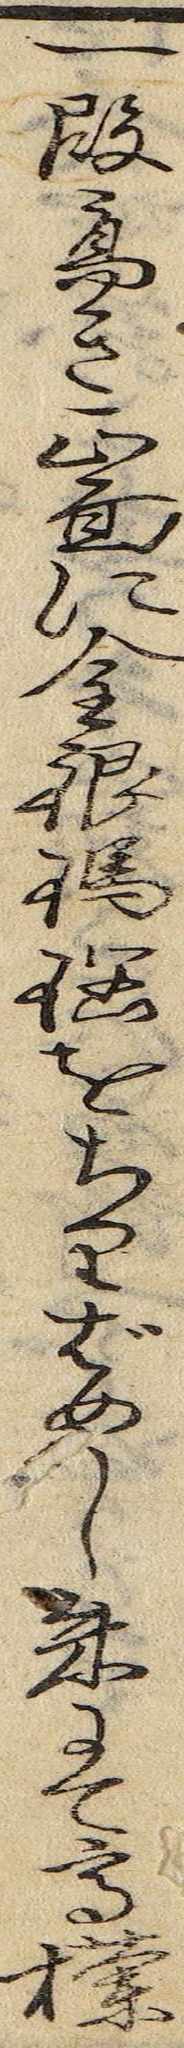一段嵩き正面に金銀瑪瑙をちりばめし朱にて高欄
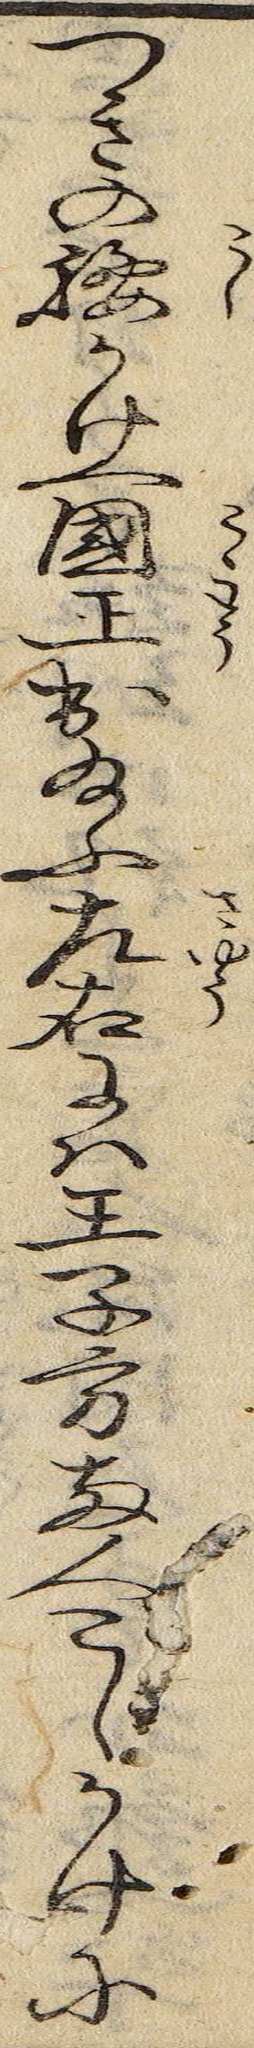つきの腰かけへ國王出給ふ左右にハ王子方両人こしかけに
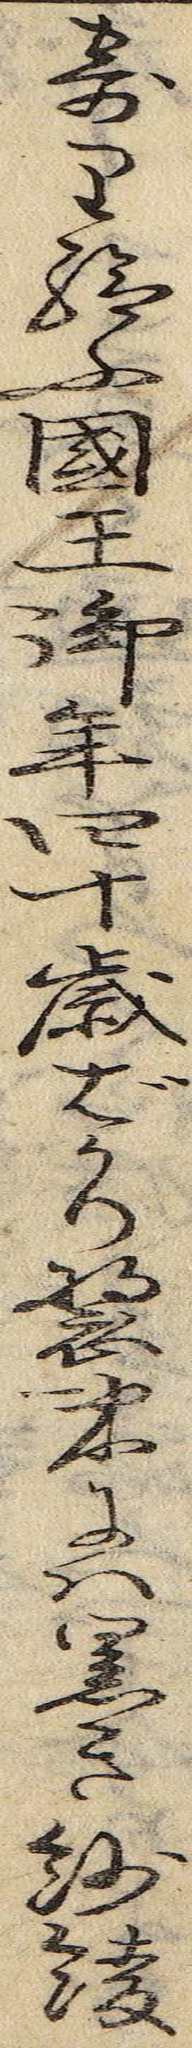寄り給ふ國王御年四十歳ばかり装束にハ黒き紗綾
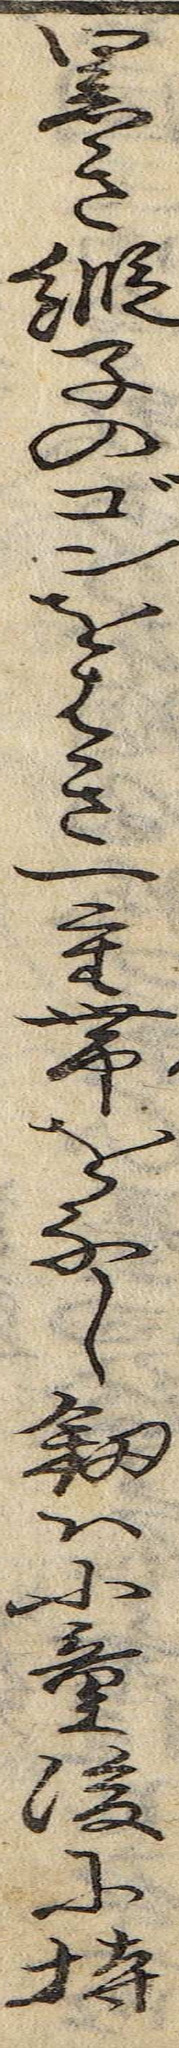黒き緞子のゴンをはき一重帯をなし釼ハ小童後に持
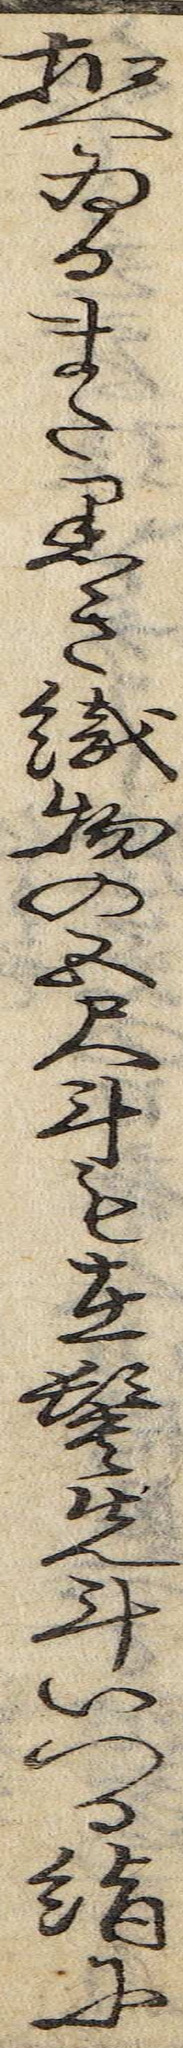扣へゐるまた黒き織物の五尺斗も在髯先斗いづる絹に
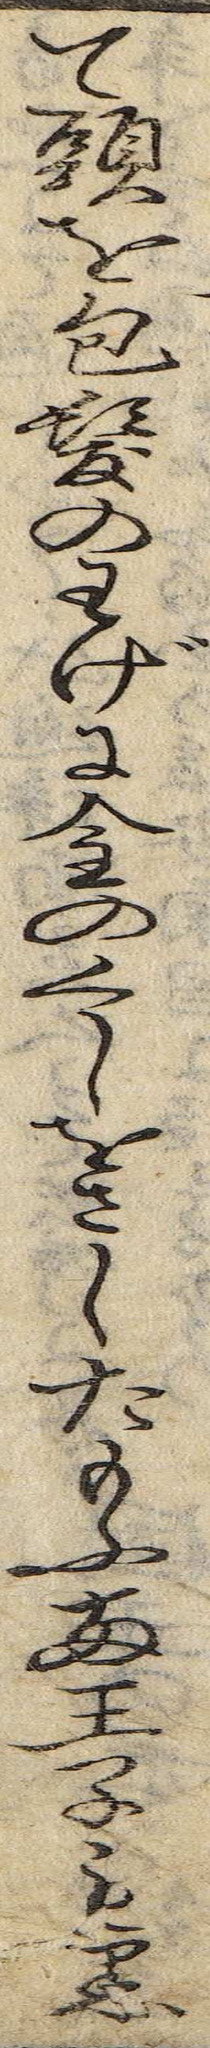て頭を包髪のわげに金のくしをさしたもふ両王子方黒
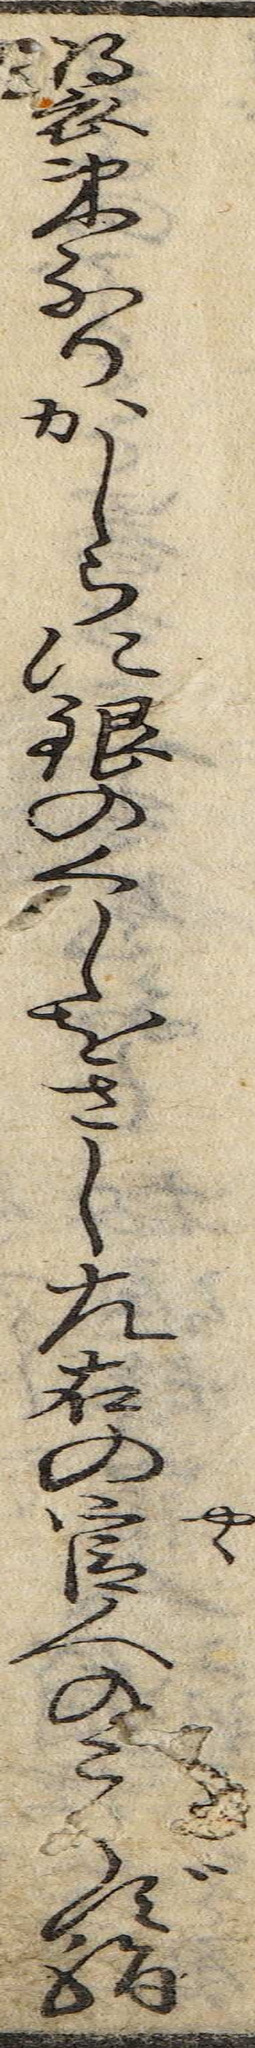装束なりかしらに銀のくしをさし左右の官人のこらず絹
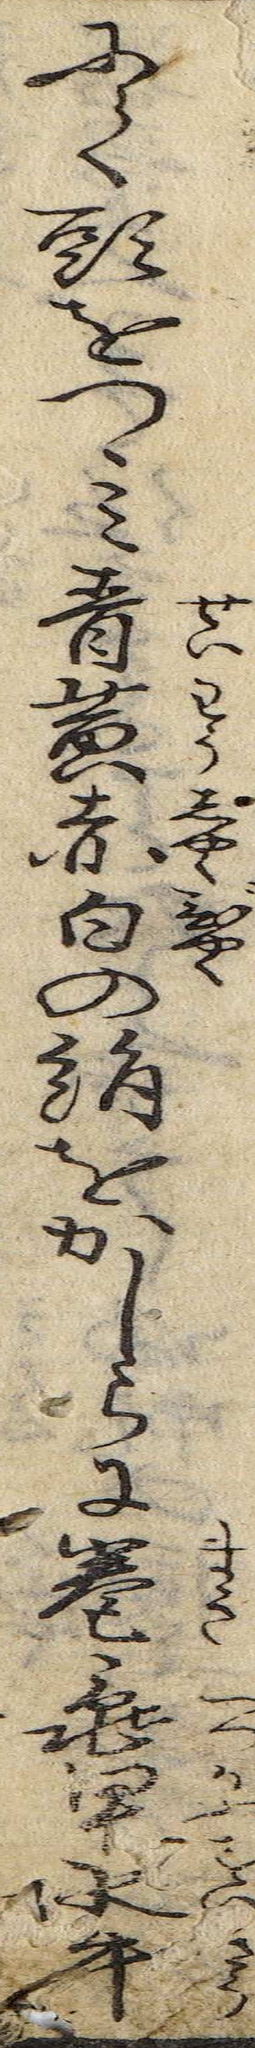にて頭をつゝみ青黄赤白の絹をかしらに巻龜甲水牛
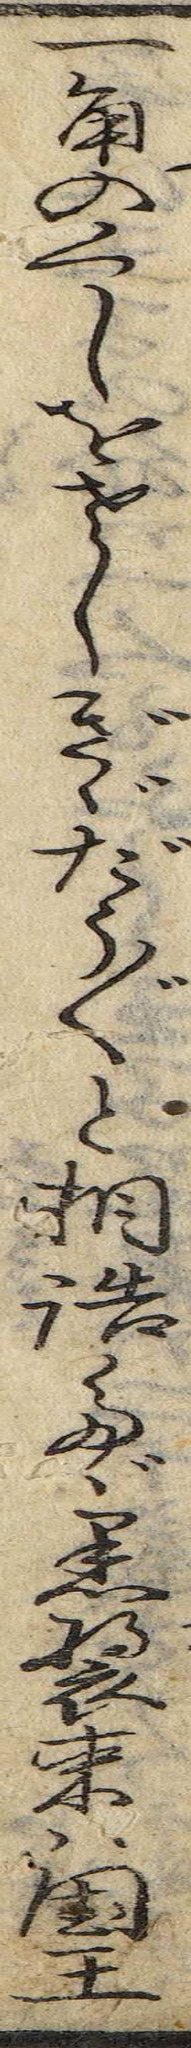一角のくしをさしぎゞだう〴〵と相詰たゞ黒装束ハ国王
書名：南漂記
